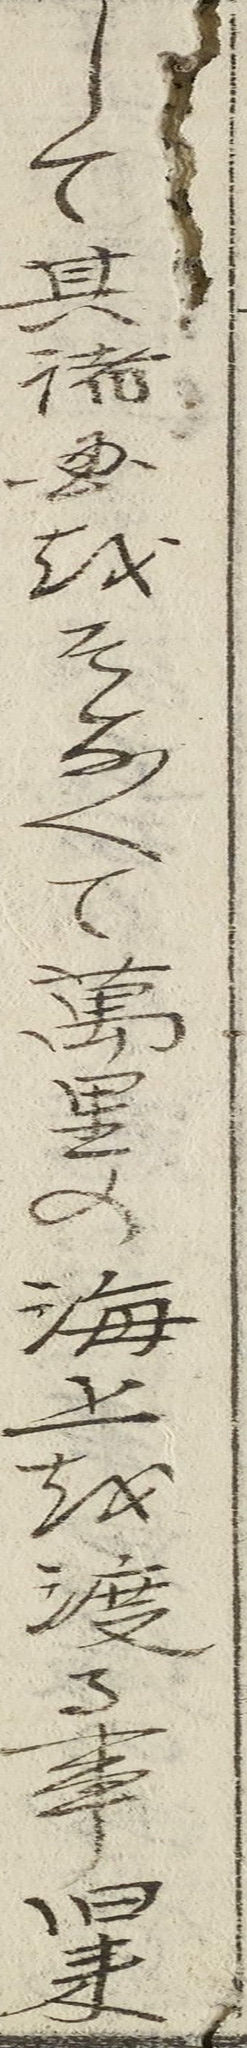して其諸国をそなへて万里の海上を渡る事旧来
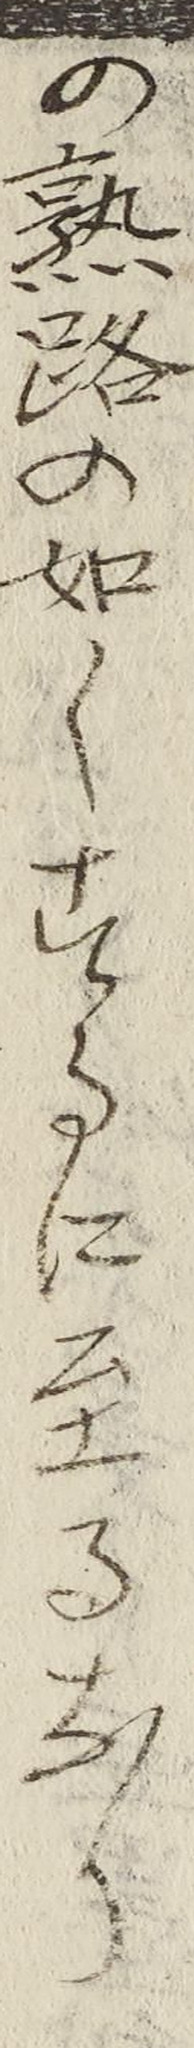の熟路の如くするに至るなり
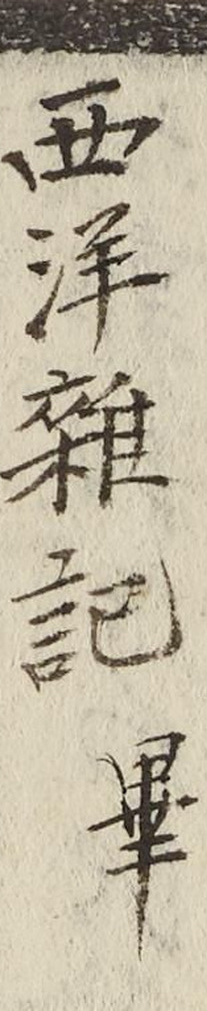西洋雑記畢
